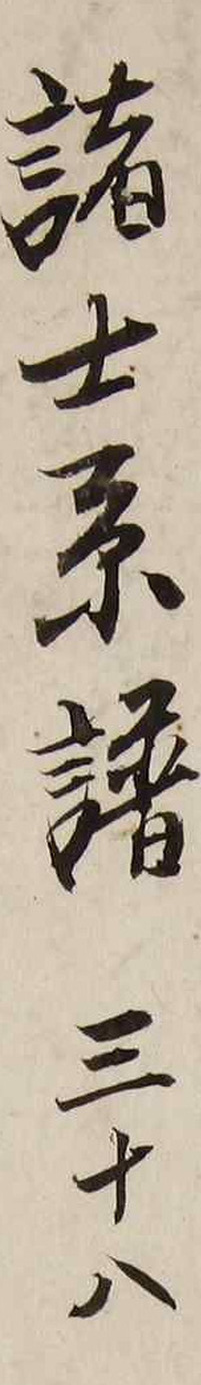諸士系譜三十八

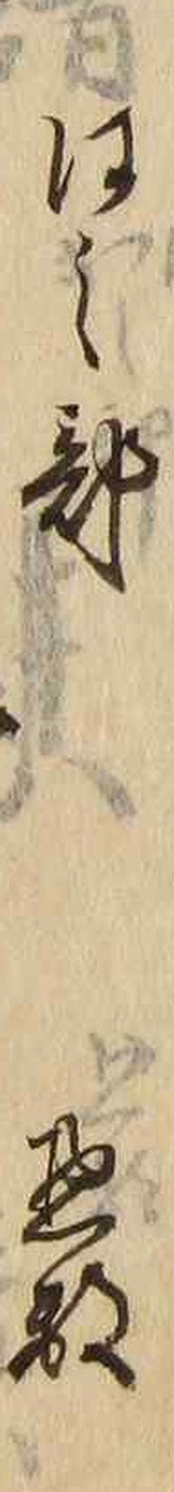は之部総数
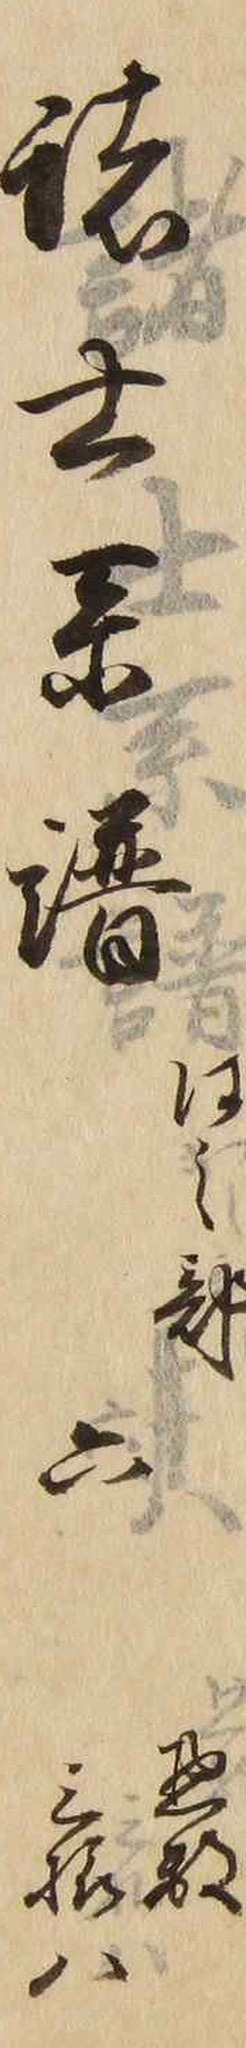諸士系譜六三拾八

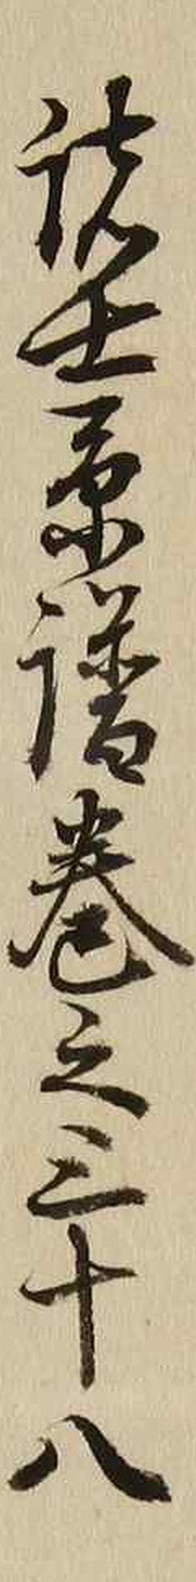諸士系譜巻之三十八
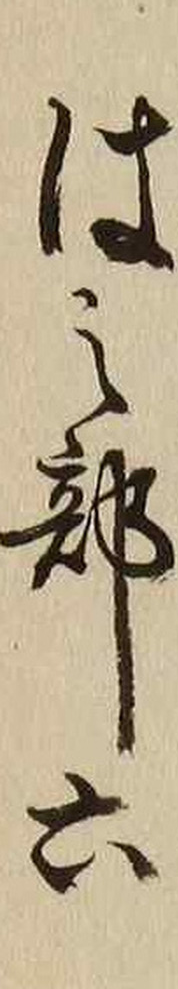は之部六
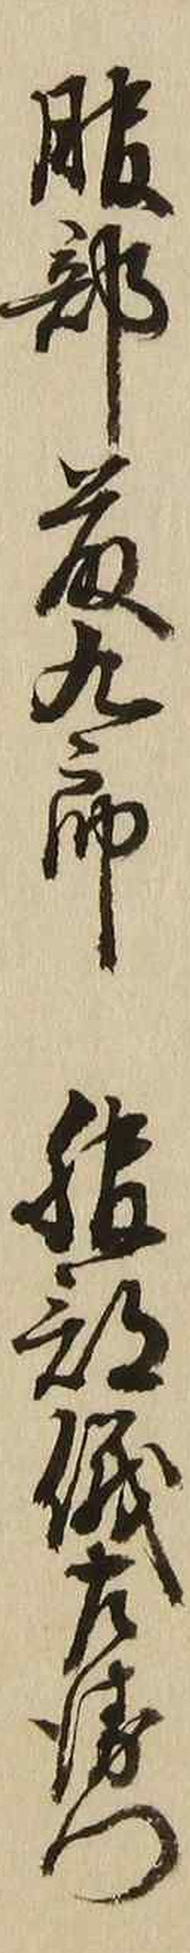服部藤九郎服部儀左衛門
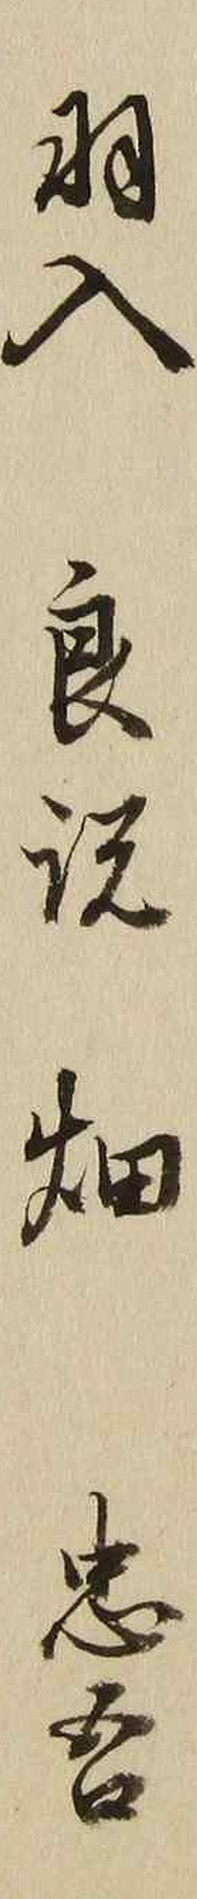羽入良説畑忠吾

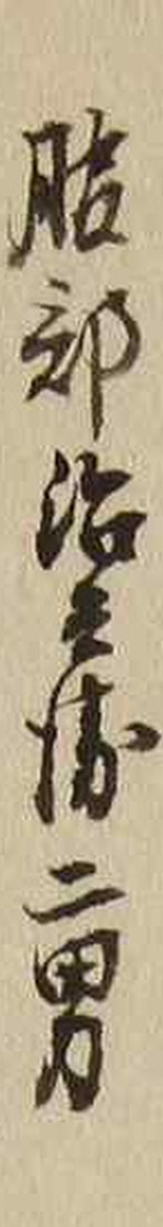服部治兵衛二男
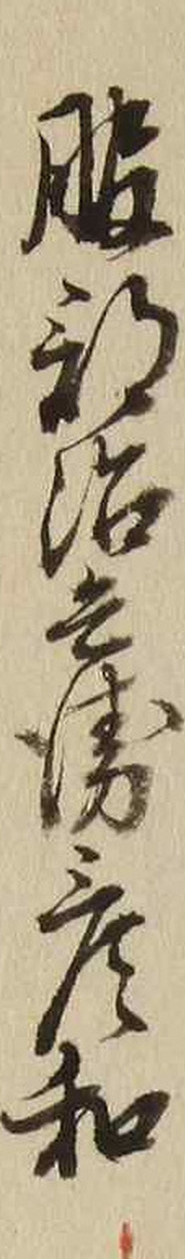服部治兵衛二男
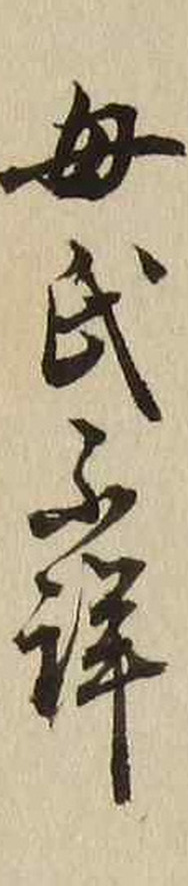母氏不詳
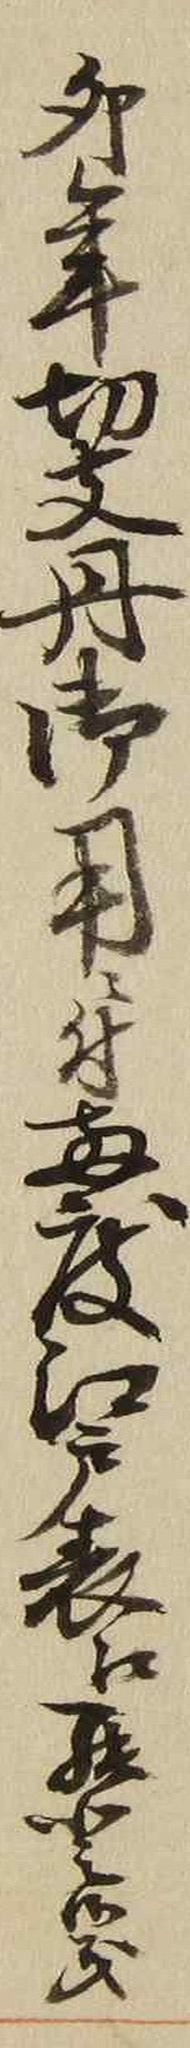卯年切支丹御用に付両度江戸え罷登候義
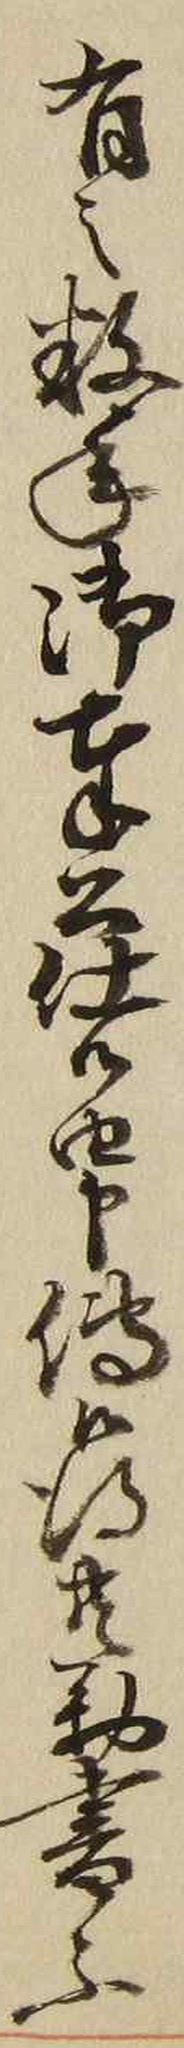有之数年御奉公仕候由申伝候得共勤書不
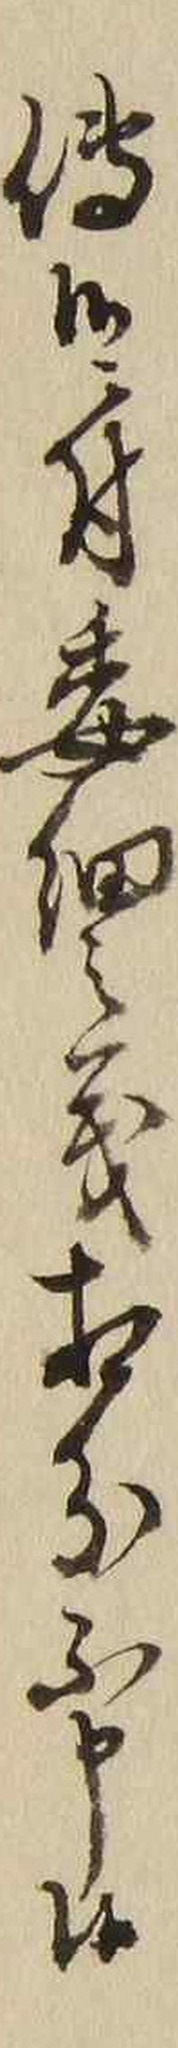伝候に付委細之義相分不申候

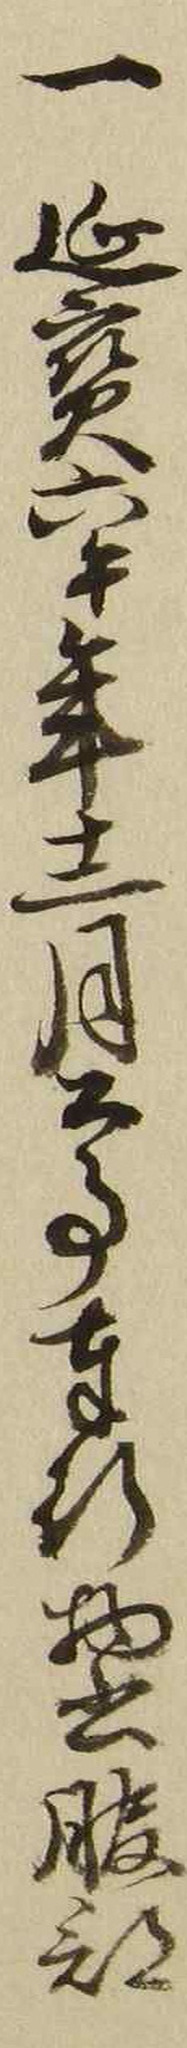一延宝六午年十二月公事奉行物書服部
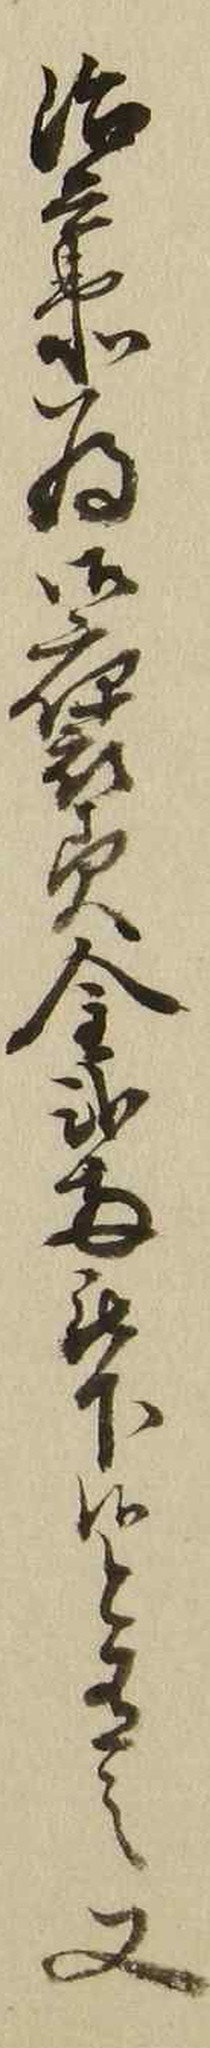治兵衛為御褒美金弐両被下候と有之又
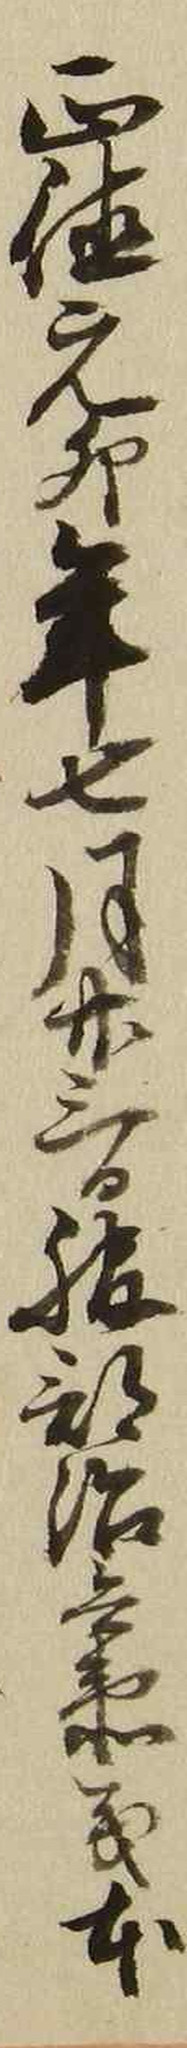正徳元卯年七月廿三日服部治兵衛義本
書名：諸士系譜　巻之38　は之部6
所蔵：会津若松市立会津図書館
